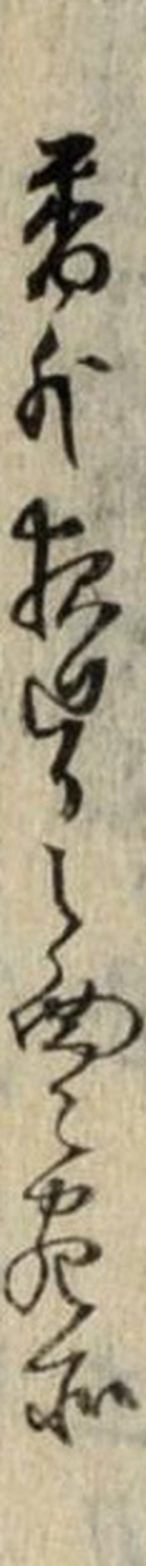番外夜廻り之面々宛所
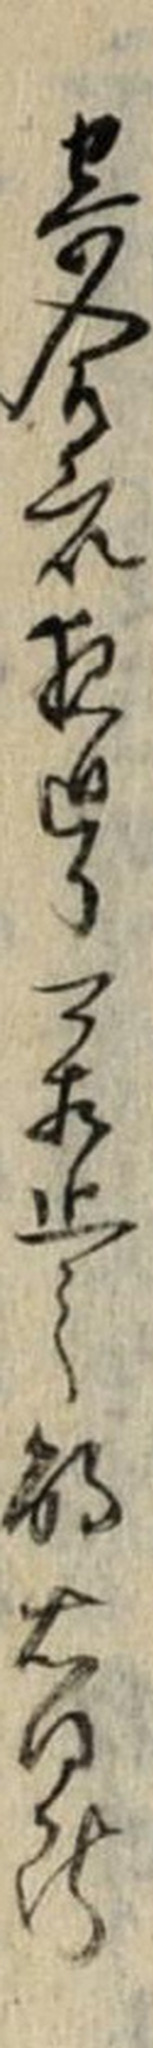寄合衆夜廻り可相止之触右同断
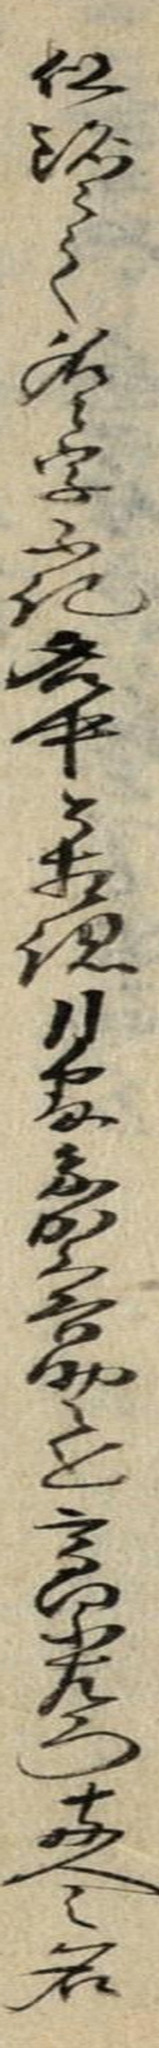但銘々之名之字不記各中と相認月番多賀谷助之進高田小左衛門両人之名
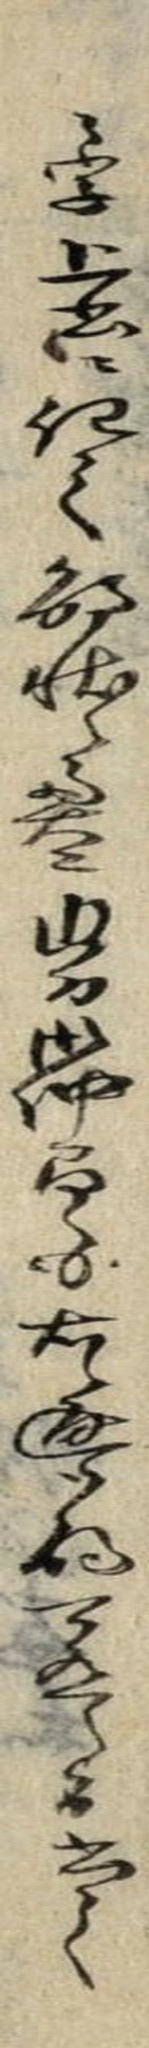之字上書に記之触状之奥に追而御仲間へも右之通御触可有之旨書之
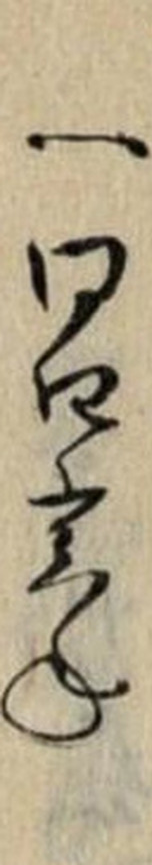一同四亥年
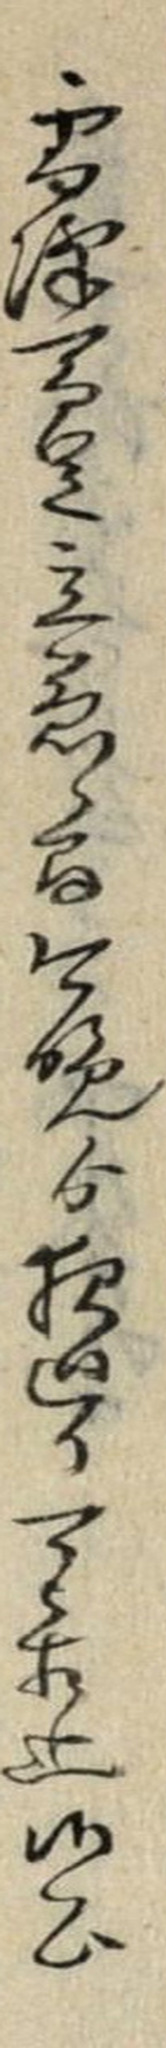雪深馬足立兼候間今晩ゟ夜廻り可被相止候以上
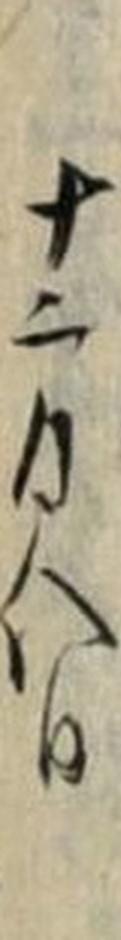十二月八日
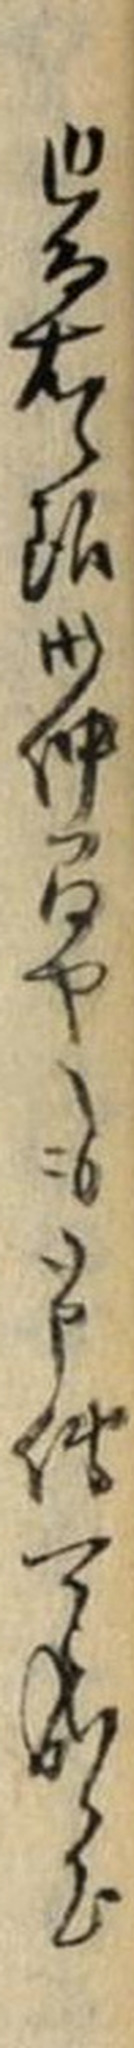追而右之趣御仲間中へも御申伝被成候以上
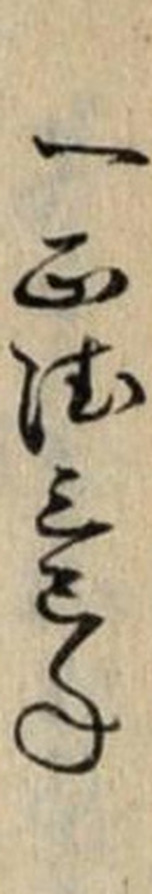一正徳三巳年
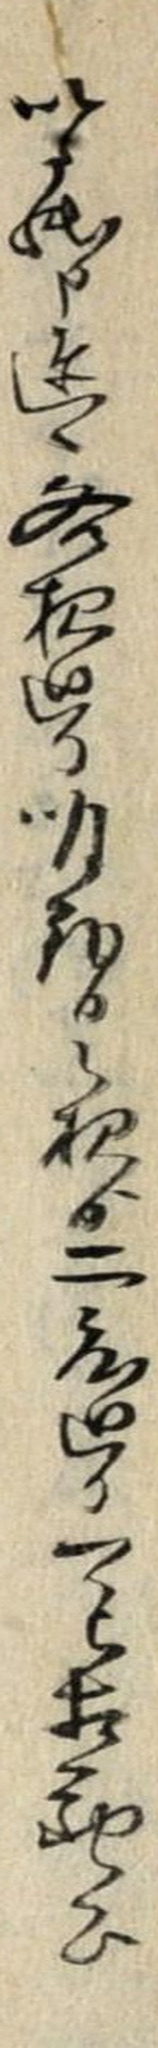以手紙申達候各夜廻り明朔日之夜ゟ二度廻り可被相勤候以上
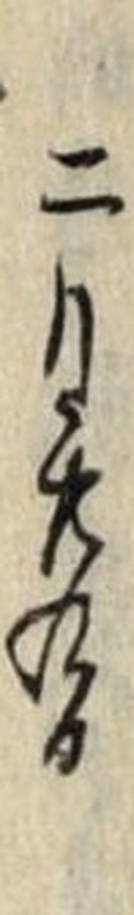二月廿九日
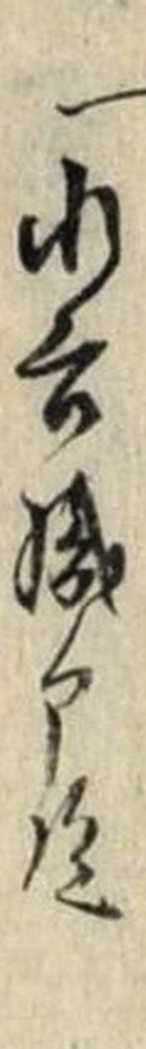水谷織部殿
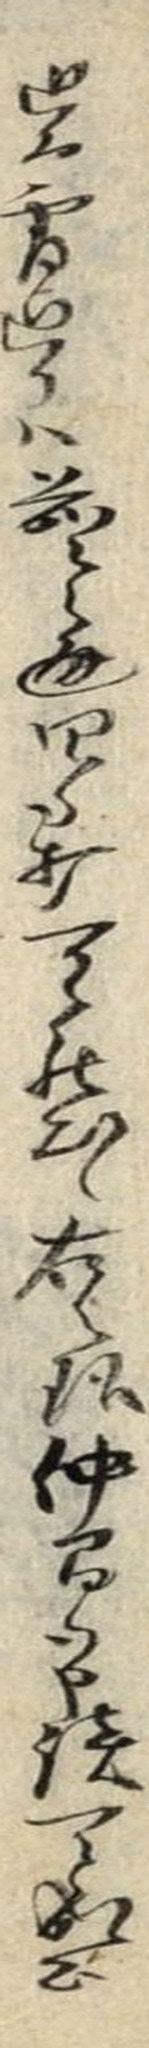追而宵廻りは前々之通四ッ打可被罷出候右之趣仲間御申談可被成候以上
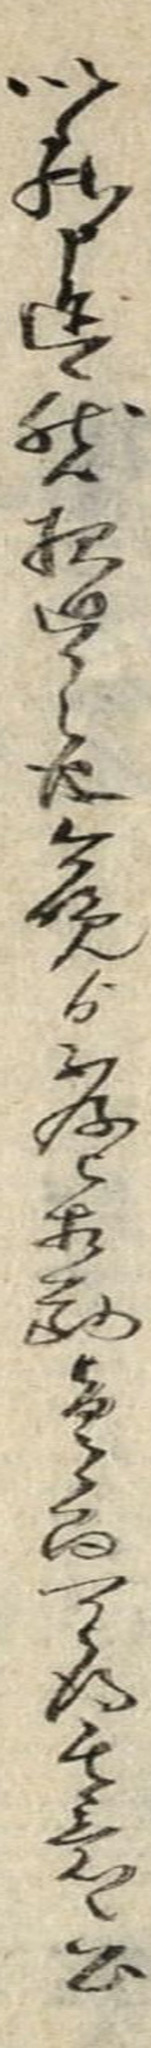以手紙申達候然は夜廻り之儀今晩ゟ不及被相勤旨に候間可被得其意候以上
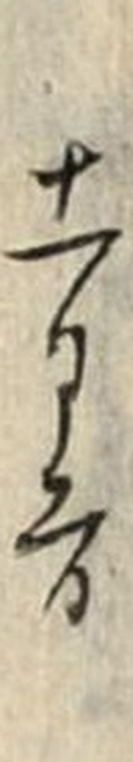十一月二日
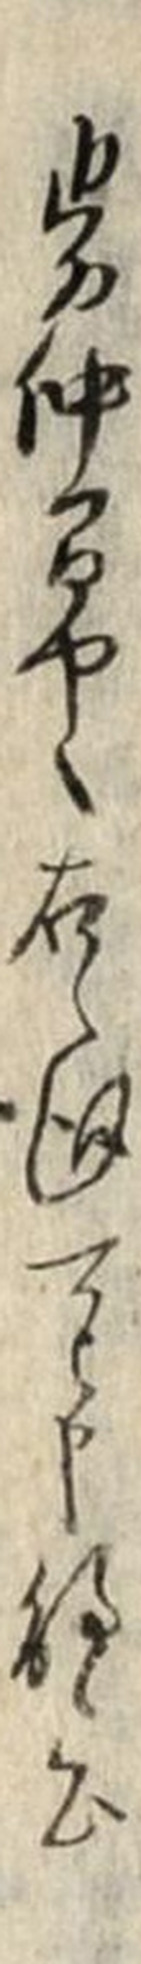追而仲間中へ右之趣可被申触候以上
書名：蒐輯之部
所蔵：福井県文書館 Fukui Prefectural Archives
